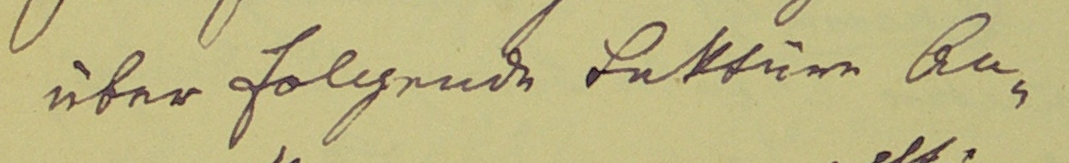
über folgende Lektüren An¬
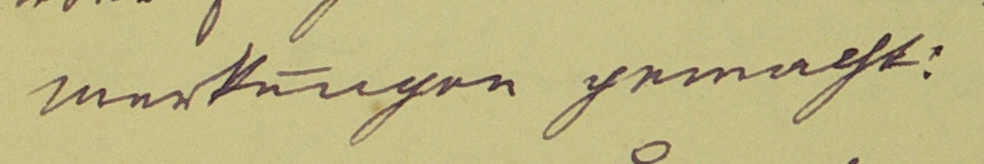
merkungen gemacht:
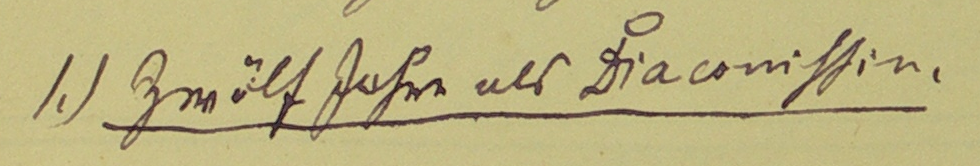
1.) Zwölf Jahre als Diakonissin
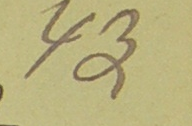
43
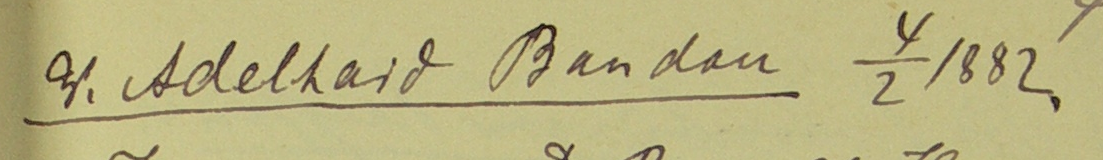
von Adelheid Bandon 4/2 1882
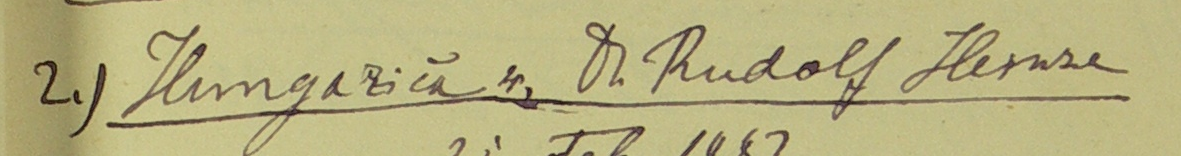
2.) Hungarica von Dr. Rudolf Heinze
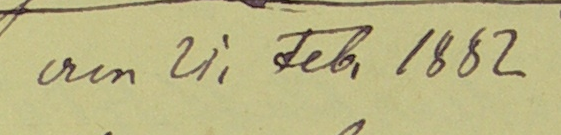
am 21. Febr. 1882
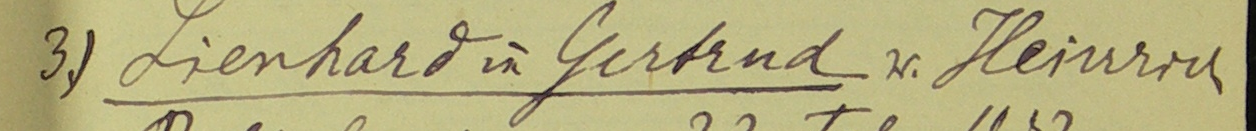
3.) Lienhard und Gertrud von Heinrich
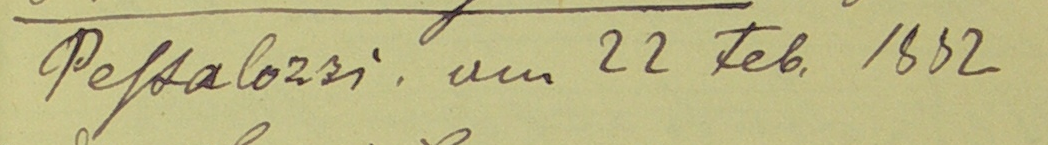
Pestalozzi am 22. Febr. 1882
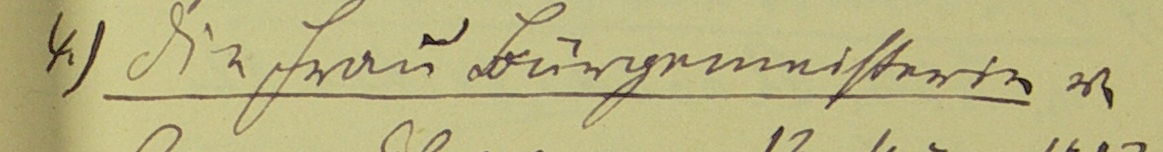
4.) Die Frau Bürgermeisterin von
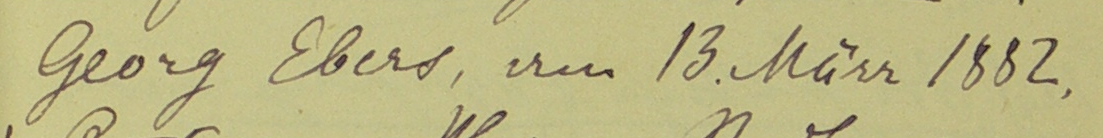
Georg Ebers am 13. März 1882
